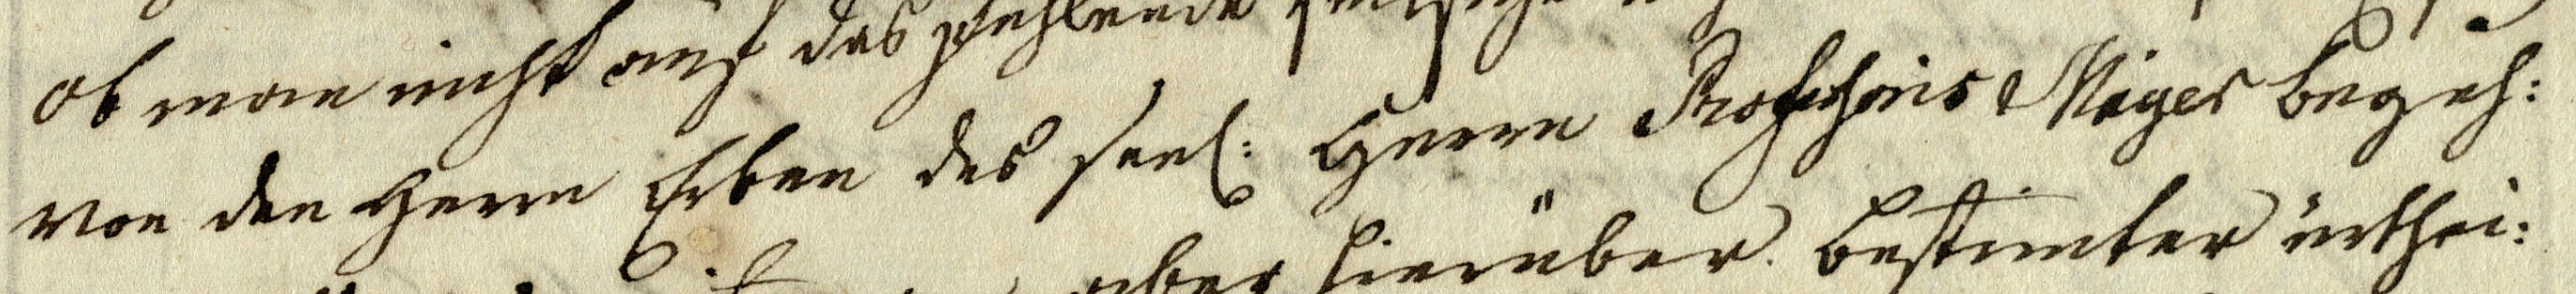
von den Herrn Erben des seel. Herrn Professoris Maÿer begeh¬
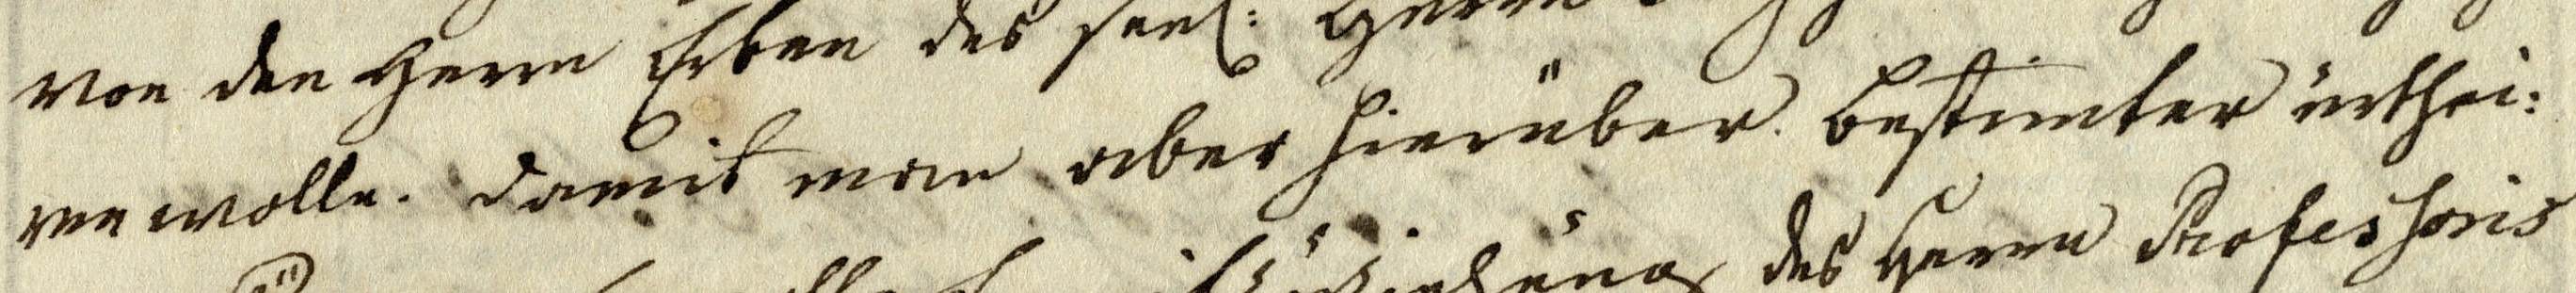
ren wolle. Damit man aber hierüber bestimter urthei¬
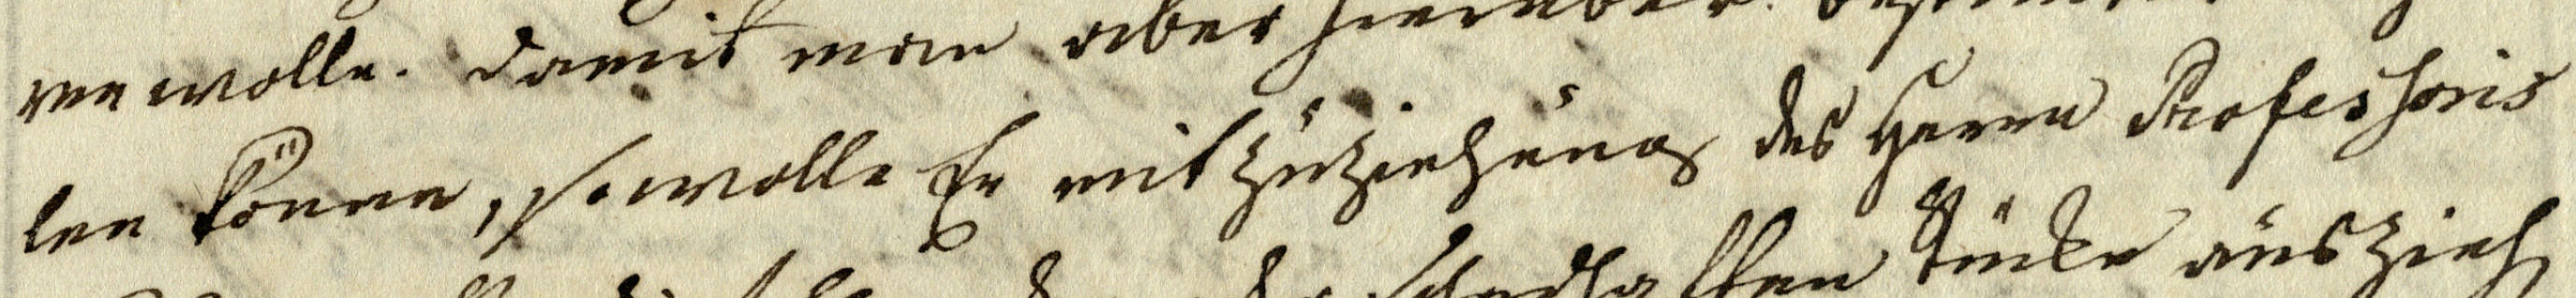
len könne, so wolle Er mit Zuziehung des Herrn Professoris
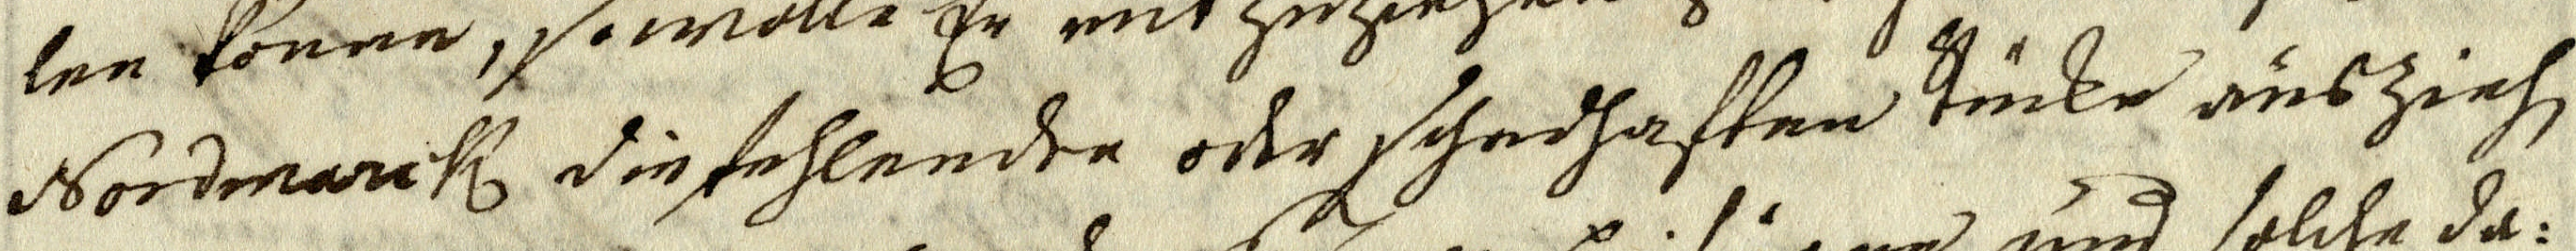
Nordmarck die fehlenden oder schadhaften Stücke auszieh
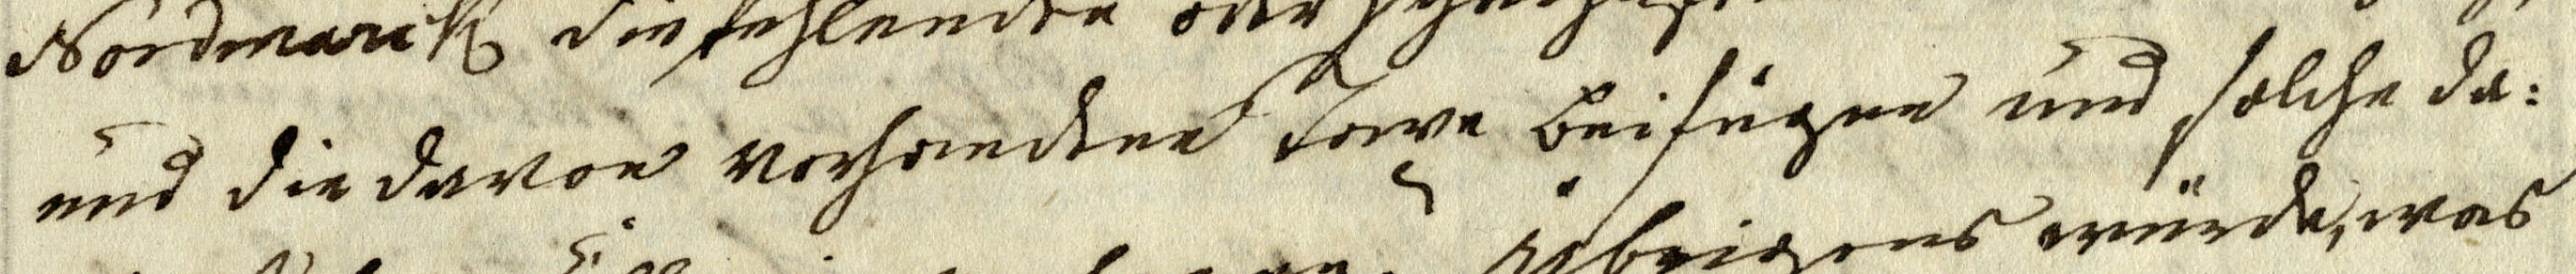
und die davon vorhandene Taxe beifügen und solche da¬
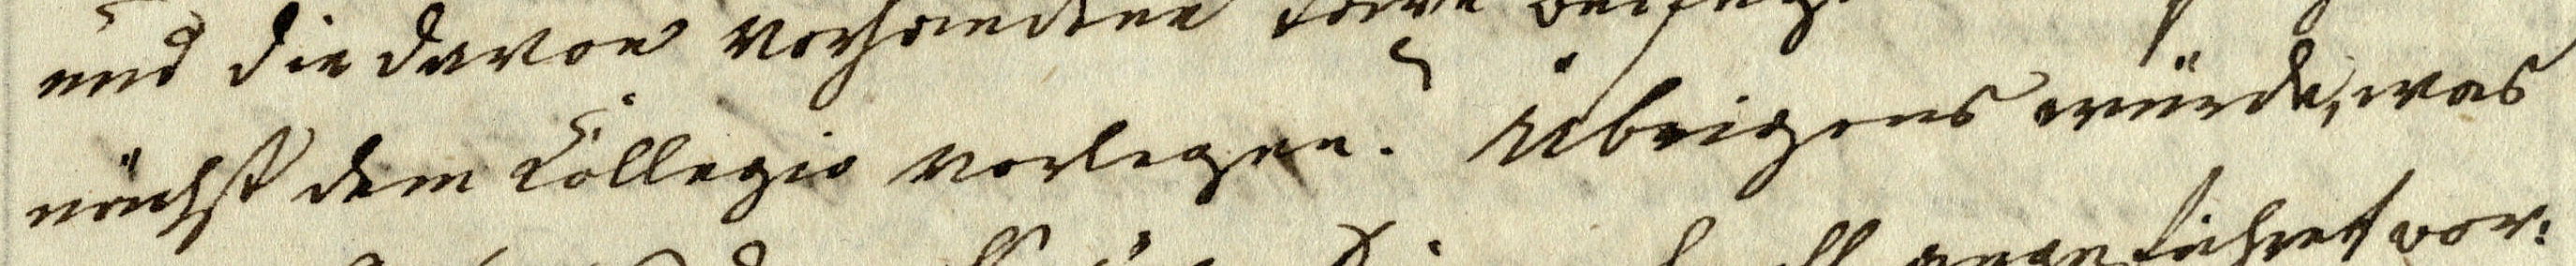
nächst dem Collegio vorlegen. Übrigens würde, was
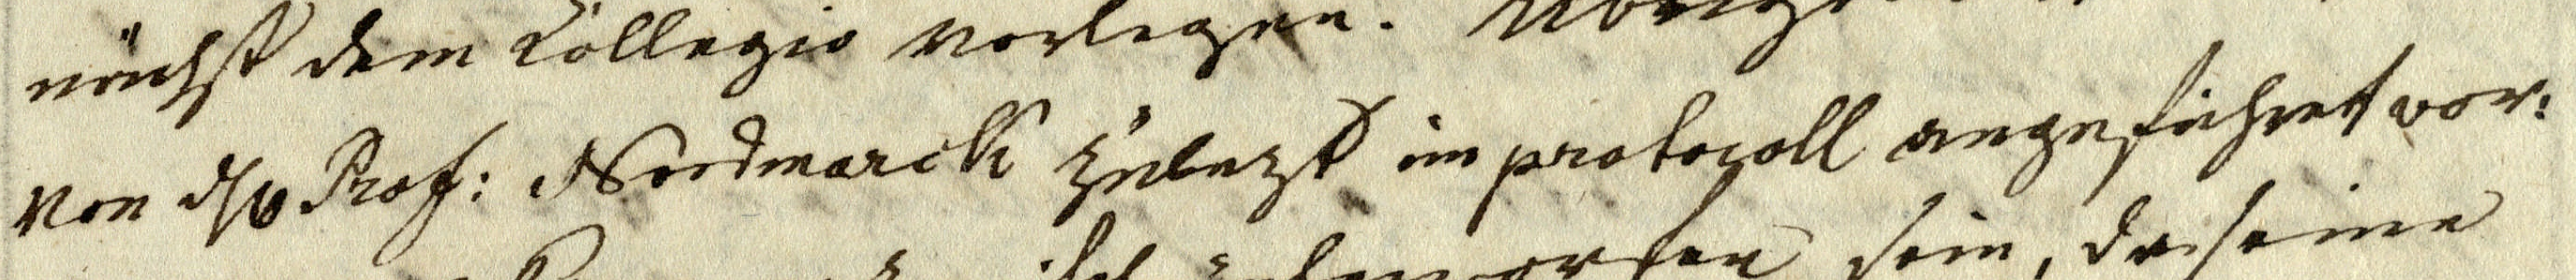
von dh Prof. Nordmarck zulezt im protocoll angeführet wor¬
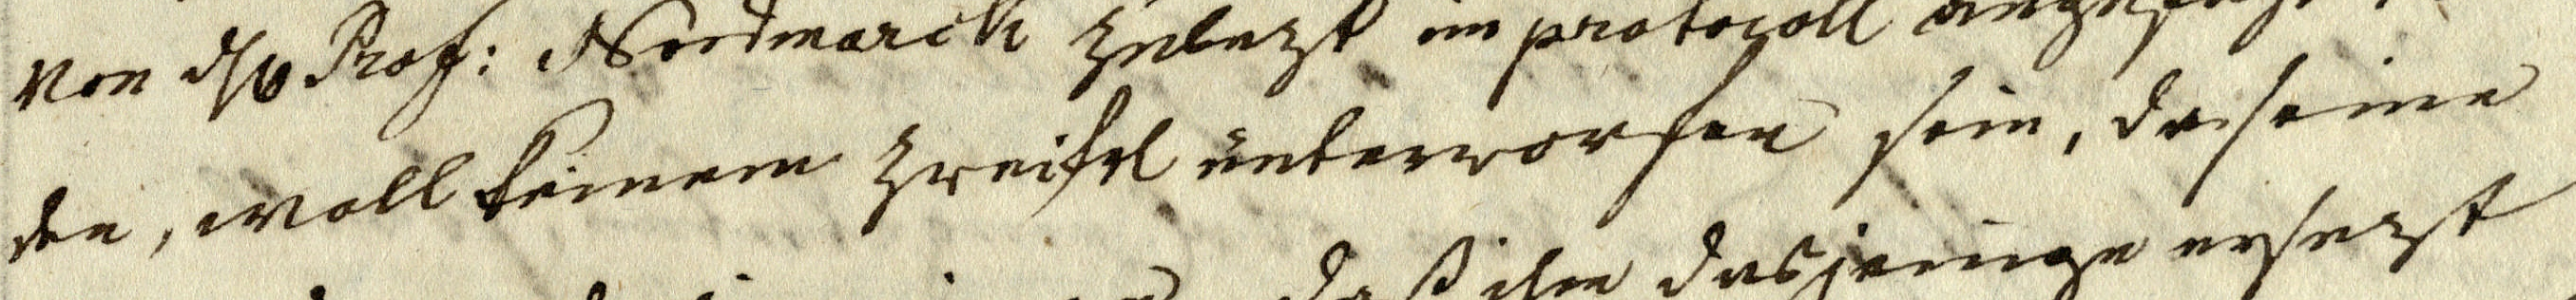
den, woll keinem Zweifel unterworfen sein, da seine
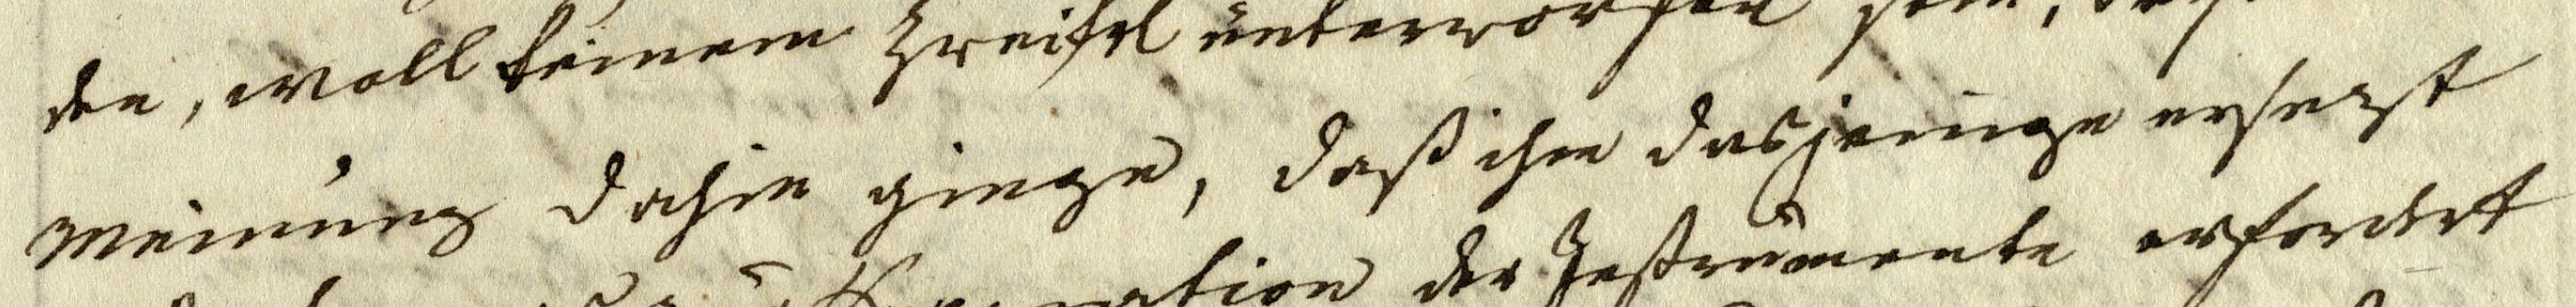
Meinung dahin ginge, daß ihm dasjenige ersezt
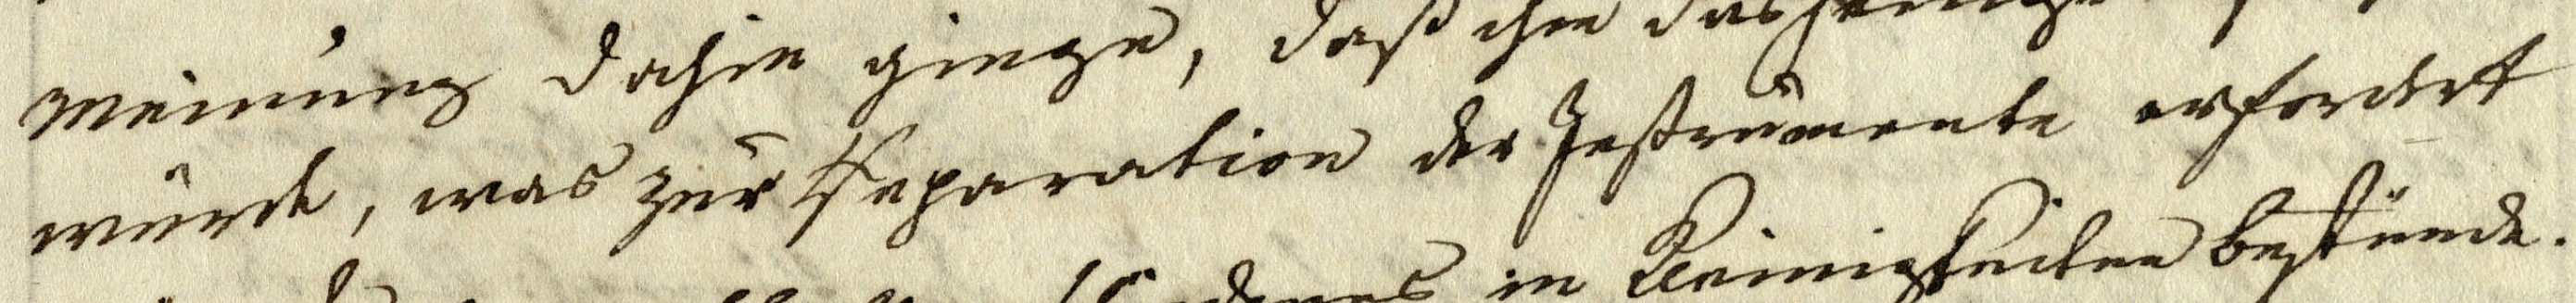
würde, was zur Reparation der Instrumente erfordert
